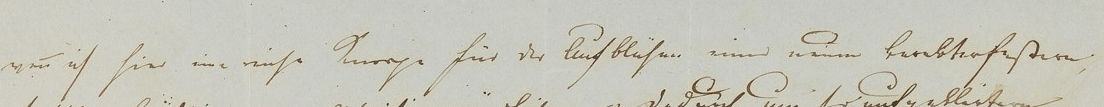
wenn ich hier eine reiche Knospe für das Aufblühen einer neuen karakterfestern,
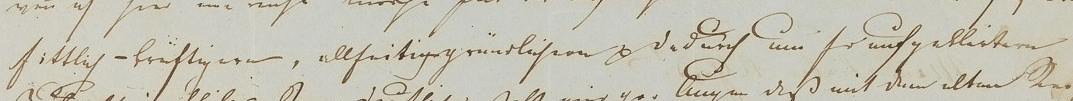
sittlich-kräftigern, allseitig-gründlichern & dadurch um so aufgeklärtern
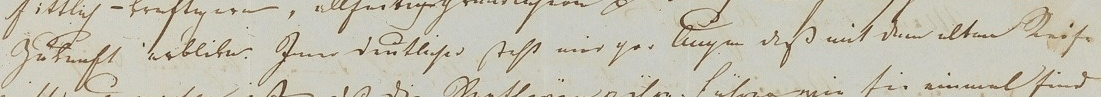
Zukunft erblike. Immer deutlicher steht mir vor Augen daß mit dem alten Reise
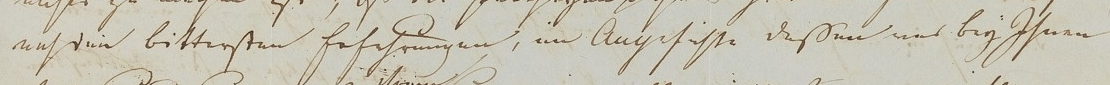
nach den bittersten Erfahrungen, im Angesichte deßen was bey Ihnen
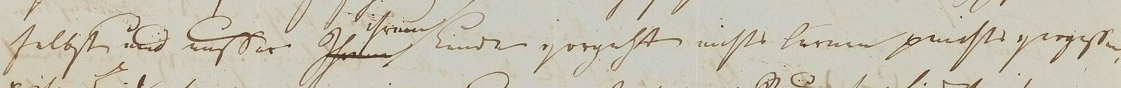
selbst und außer Ihremihrem Lande vorgeht nichts lernen & nichts vergeßen,
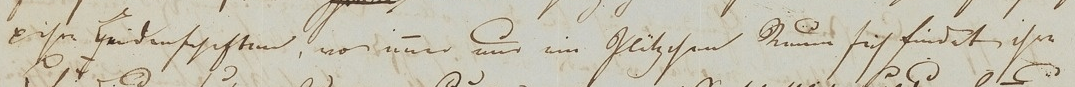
& ihre Leidenschaften, wo immer nur ein Plätzchen Raum sich findet, ihre
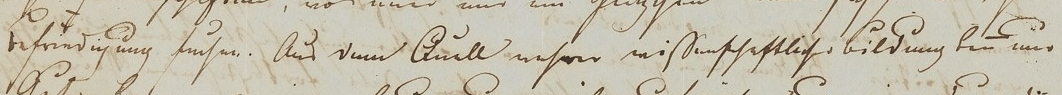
Befriedigung suchen. Aus dem Quell wahrer wißenschaftlichen Bildung kann nur
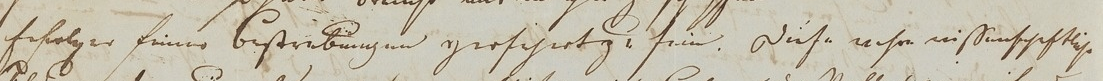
Erfolges seiner Bestrebungen versichert zu sein. Diese wahre wißenschaftliche
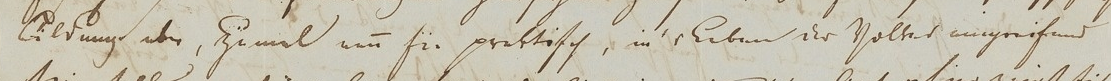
Bildung aber, zumal wenn sie praktisch, in's Leben des Volkes eingreifend
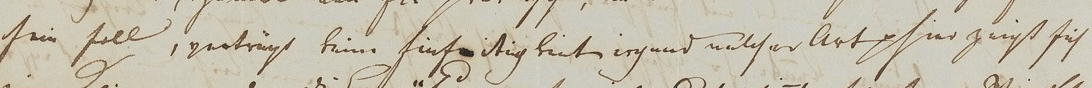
sein soll, verträgt keine Einseitigkeiten irgend welcher Art & hier zeigt sich
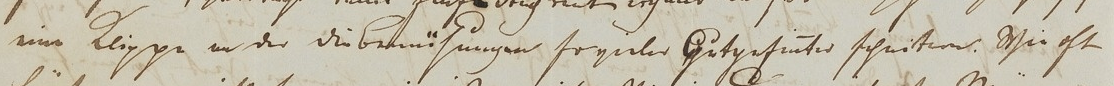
eine Klippe an der die Bemühungen so vieler Gutgesinnter scheitern. Wie oft
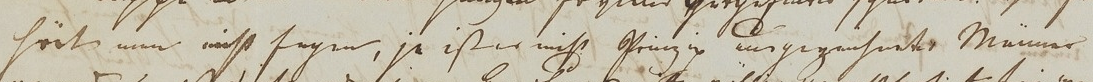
hört man nicht sagen, ja ist es nicht Prinzip ausgezeichneter Männer
